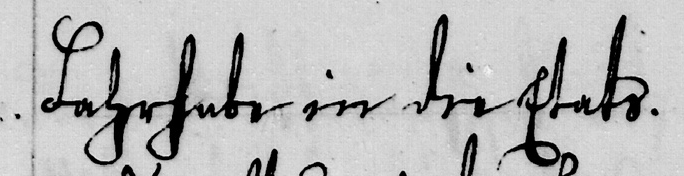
Fahrhabe in die Etats.
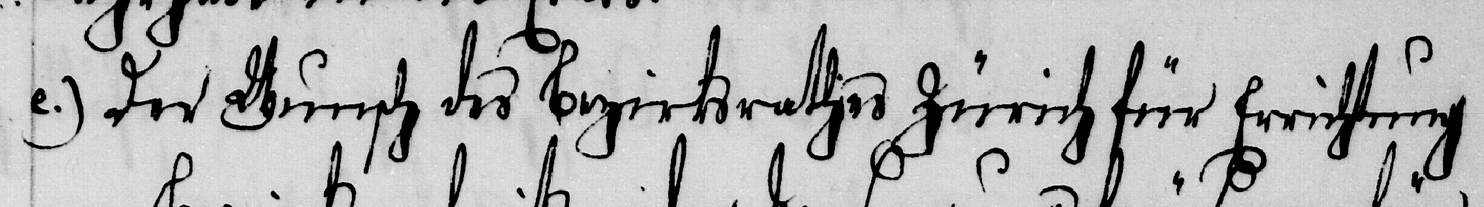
e.) Der Wunsch des Bezirksrathes Zürich für Errichtung
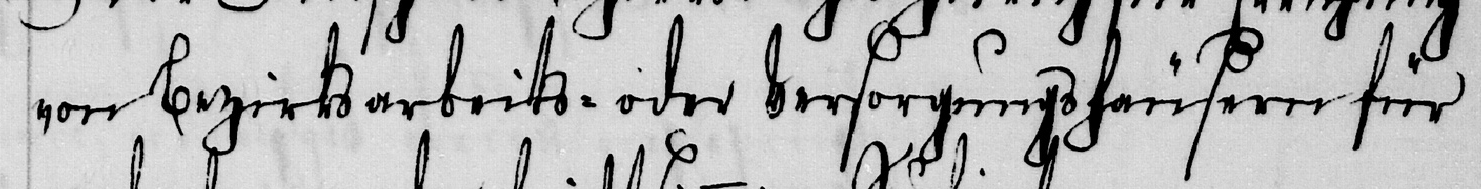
von Bezirksarbeits- oder Versorgungshäusern für
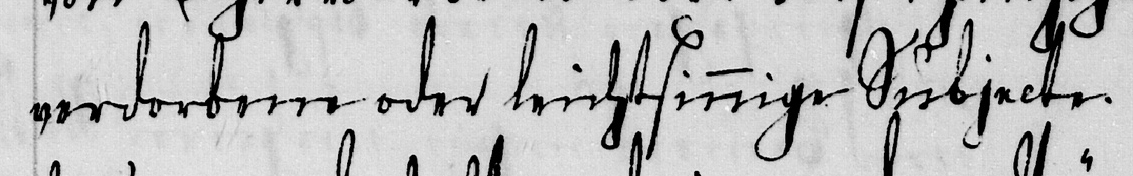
verdorbedne oder leichtsinnige Subjecte.
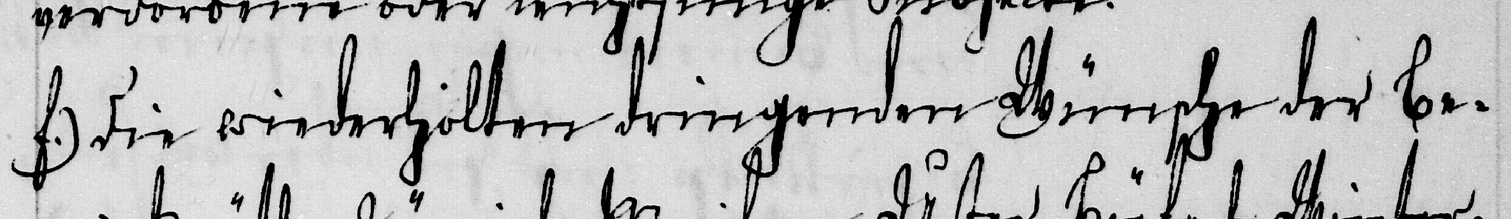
f.) Die wiederholten dringenden Wünsche der Be¬
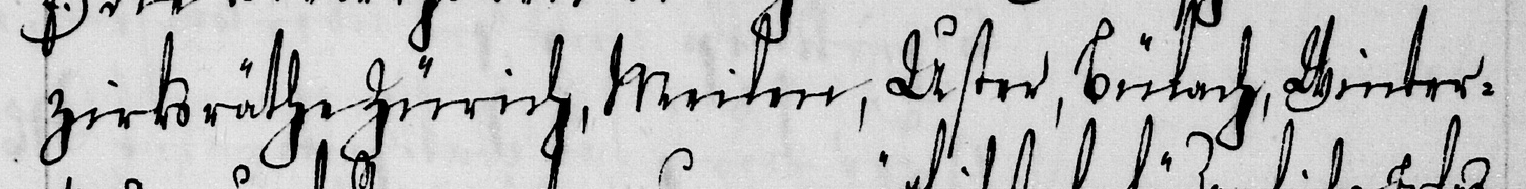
zirksräthe Zürich, Meilen, Uster, Bülach, Winter¬
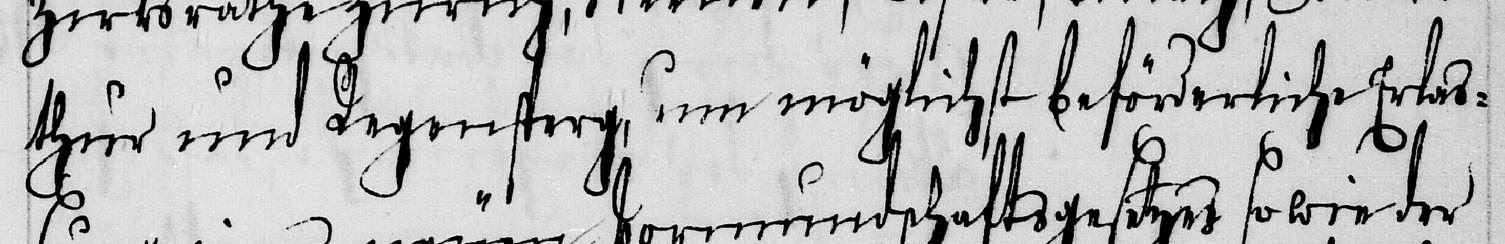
thur und Regensperg, um möglichst beförderliche Erlaß¬
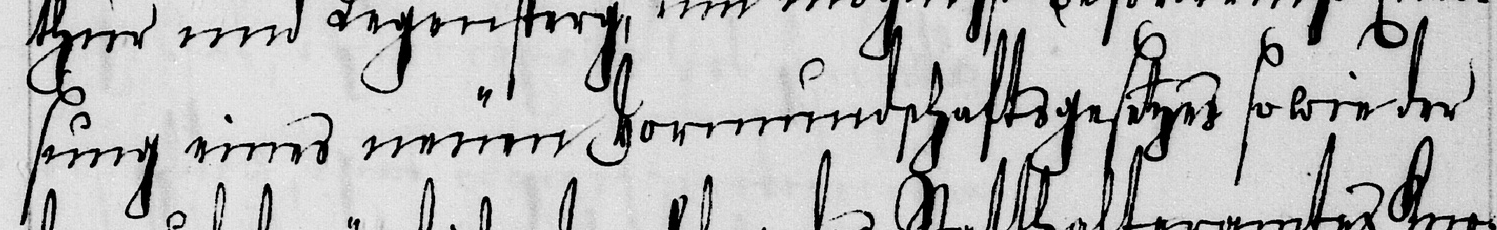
ung eines neuen Vormundschaftsgesetzes so wie der
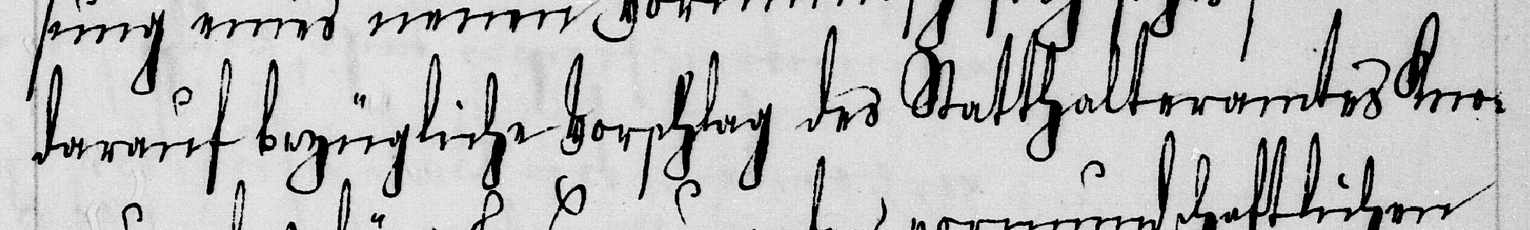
darauf bezügliche Vorschlag des Statthalteramtes Kno¬
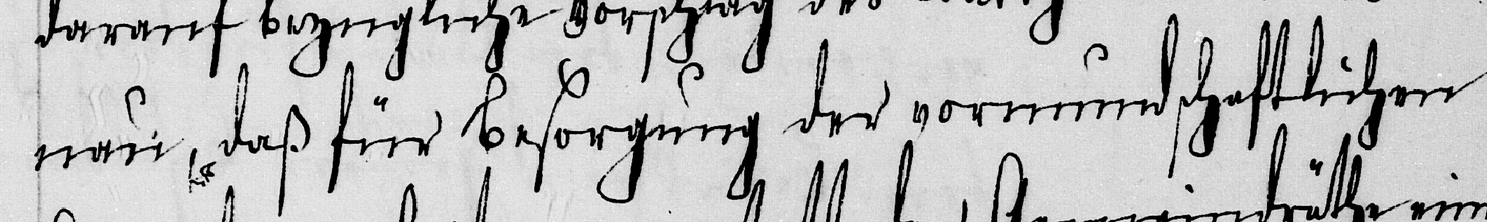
nau, daß für Besorgung der vormundschaftlichen
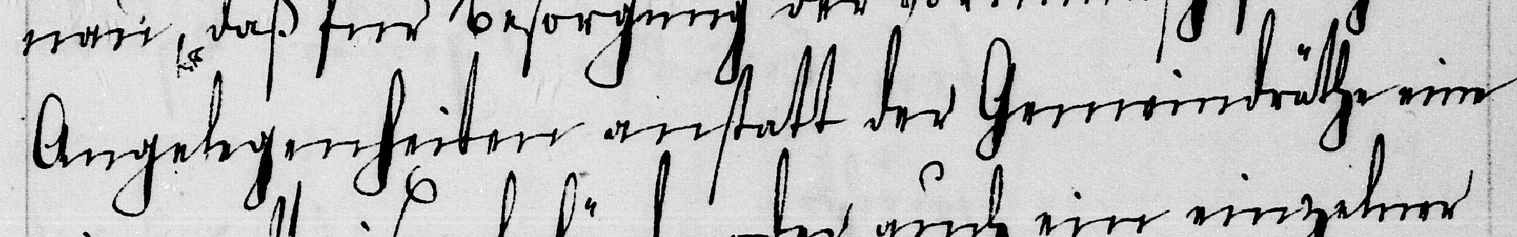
Angelegenheiten anstatt der Gemendräthe eine
